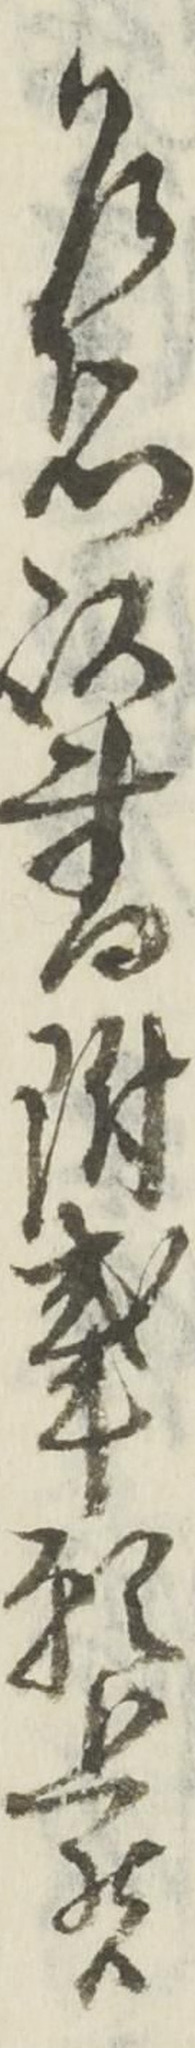乍恐以書附奉願上候
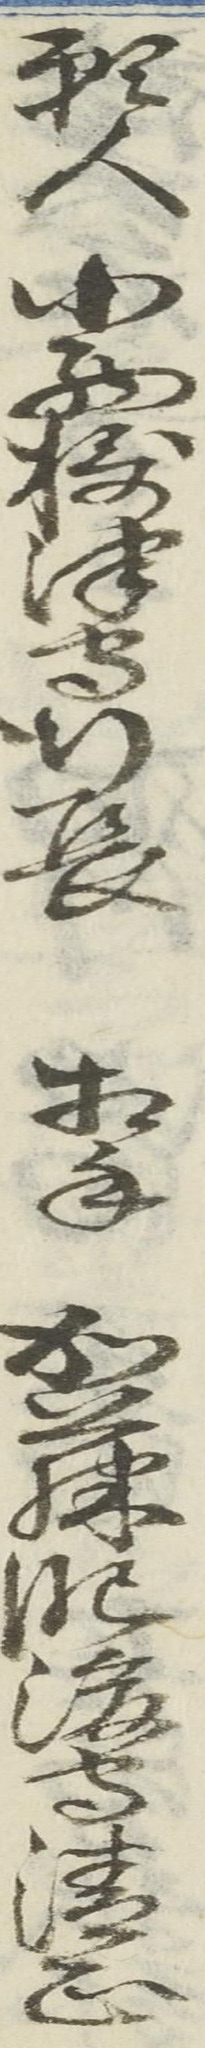願人小西摂津守行長相手加藤肥後守清正
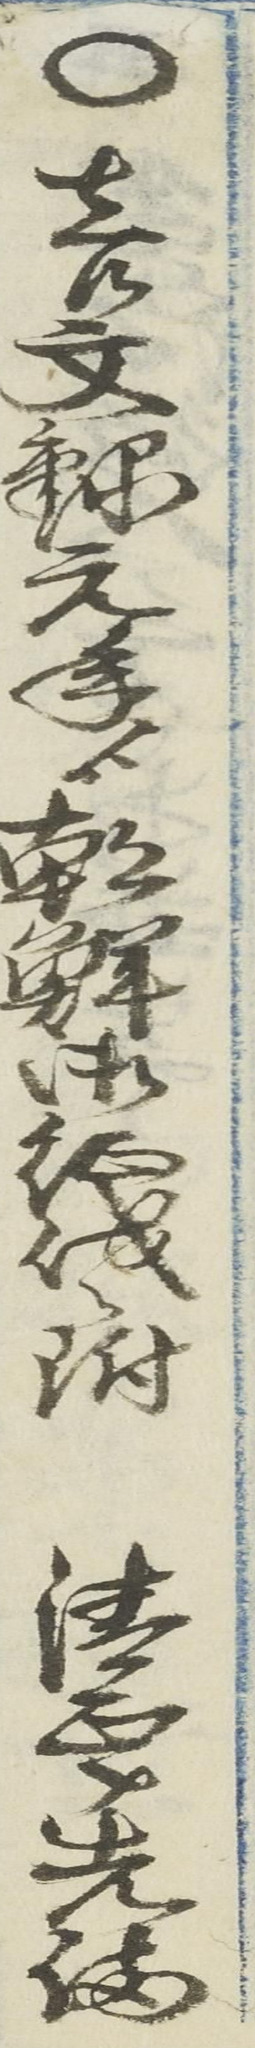〇去ル文禄元年ゟ朝鮮御征伐ニ附清正ヲ先備
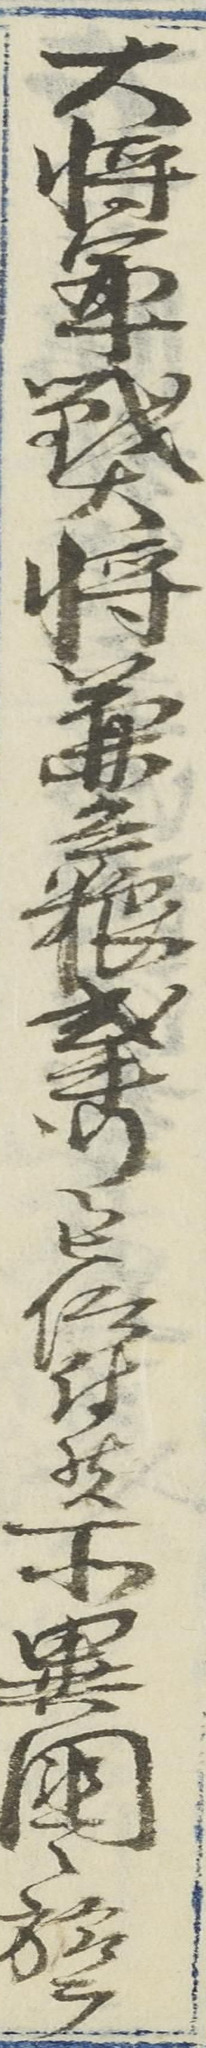大将軍戦大将兼兵粮奉行ヲ被仰付候所異国ニ於テ
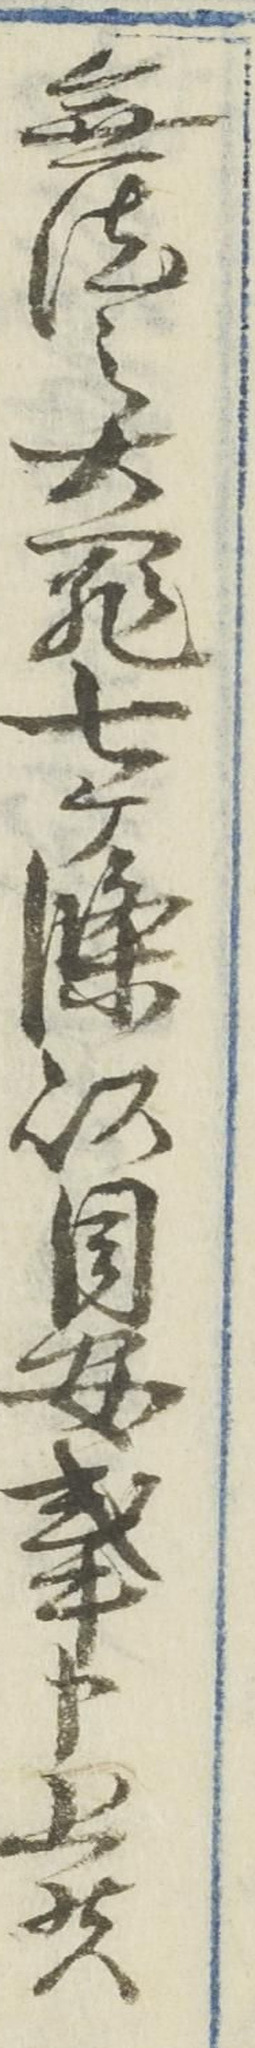無法之大罪七ケ條以目安奉申上候
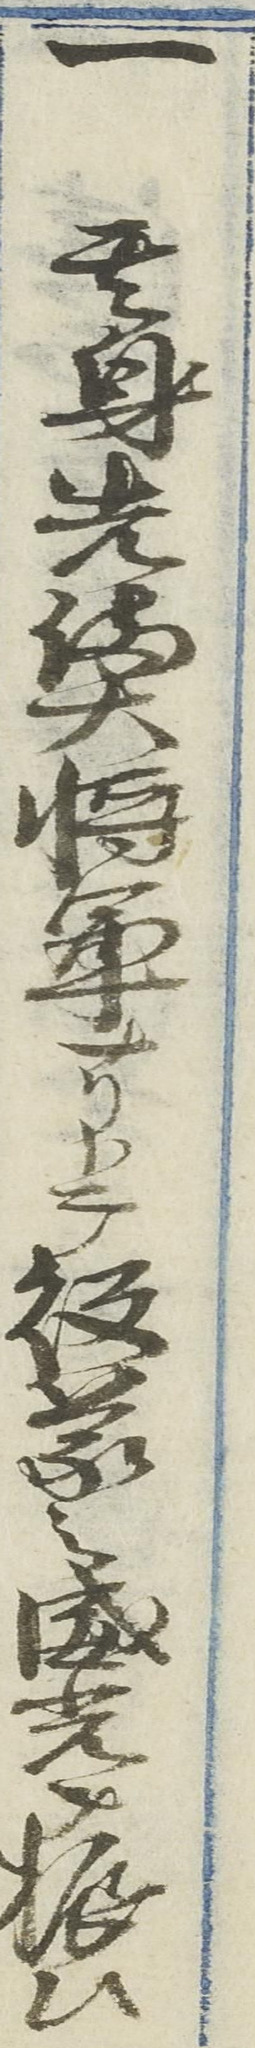一其身先備大将軍ナリトテ役義之威光ヲ振ひ
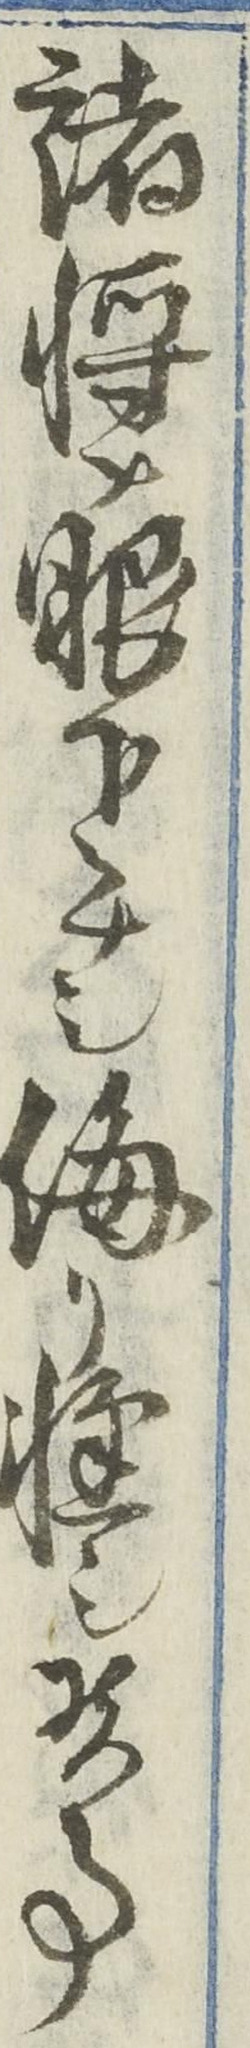諸将ヲ眼下ニナシ侮り軽シ候事
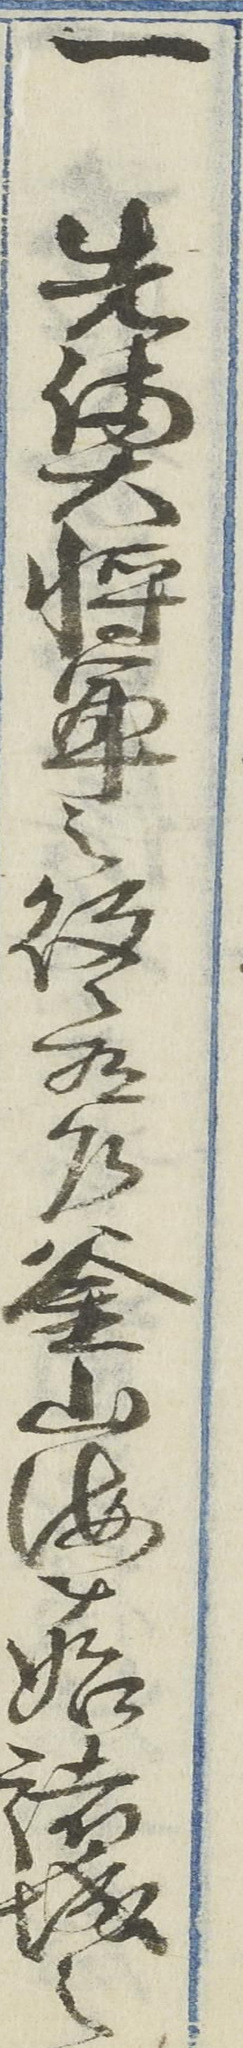一先備大将軍之役ニ有乍釜山海ヲ始諸城之
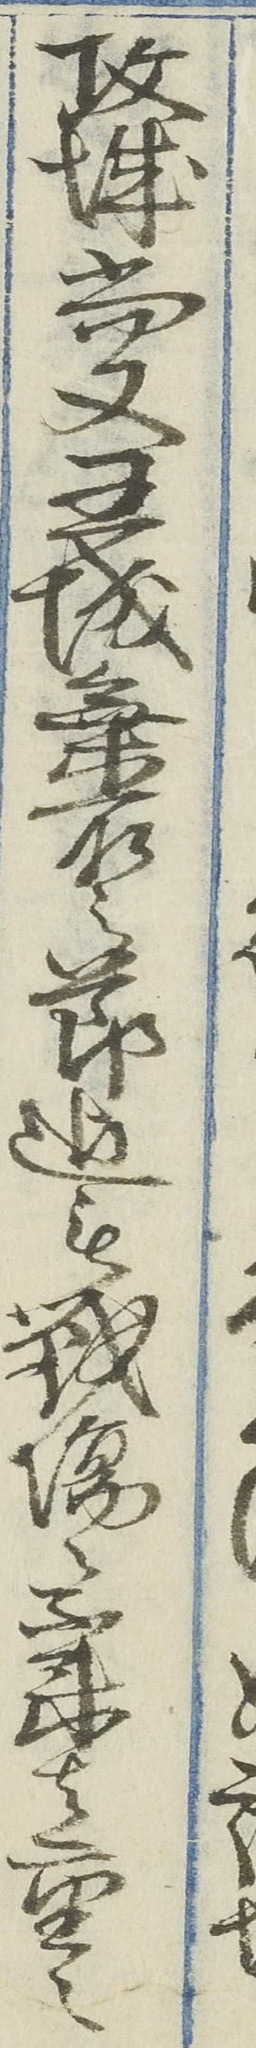攻城尚又王城乗取之節迄も戦場ニ不来は重々
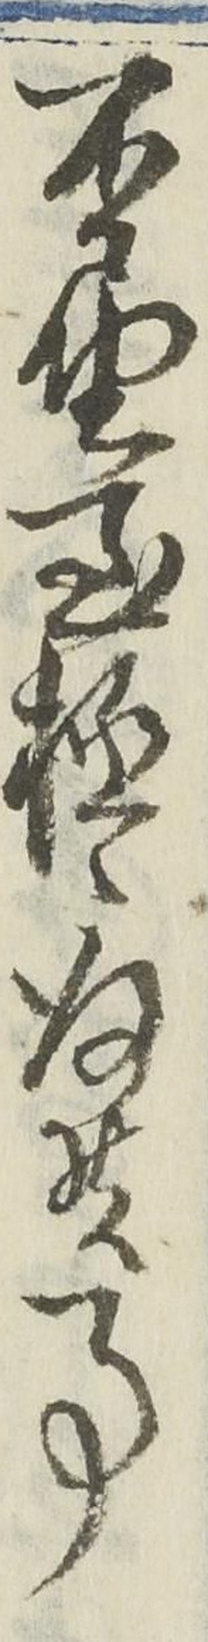不届至極存候事
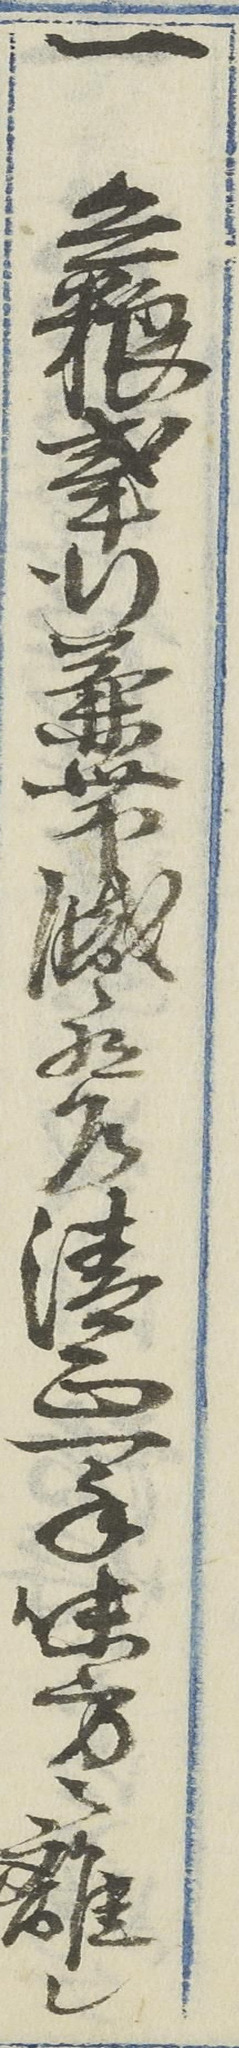一兵粮奉行兼帯職ニ有乍清正一手味方ニ離レ
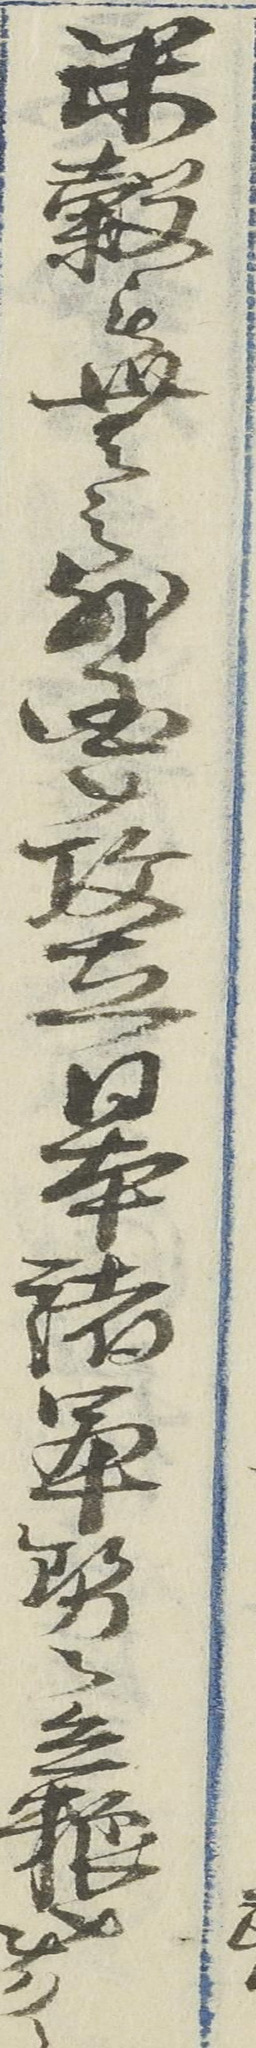米穀も無之外国を攻立日本諸軍勢ニ兵粮ヲヲクラズ
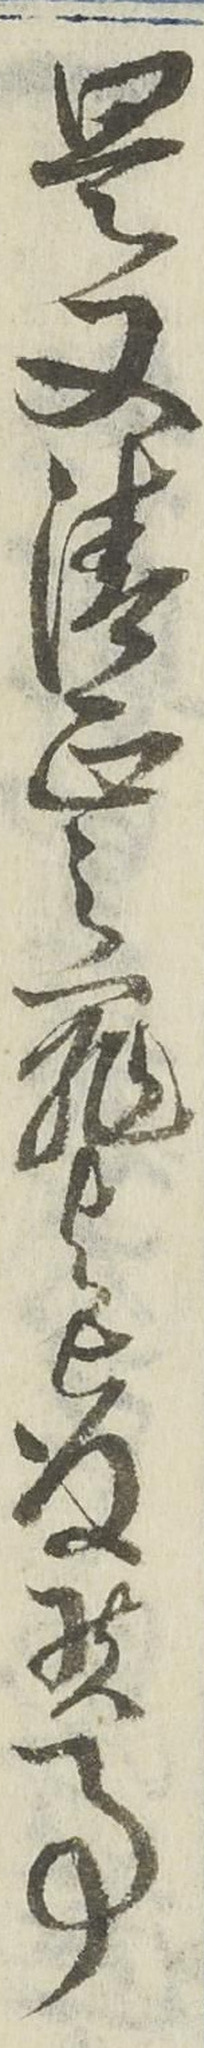是又清正之罪と被存候事

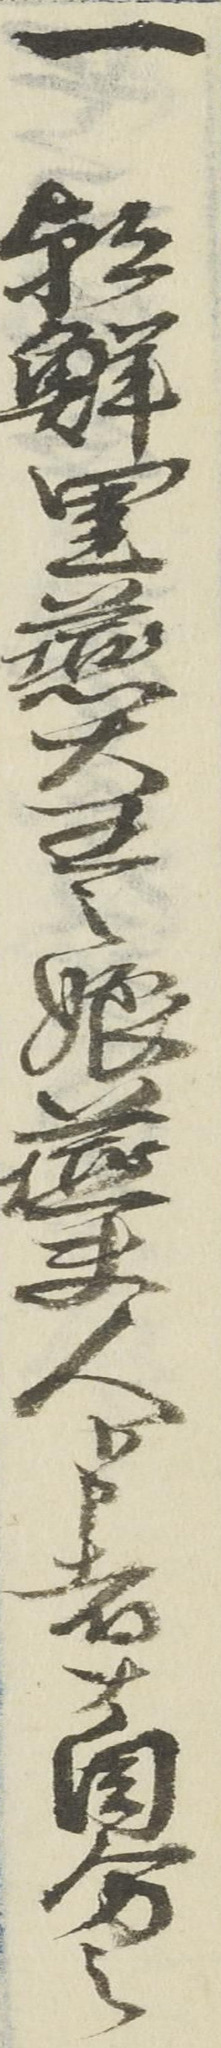一朝鮮里燕大王之娘燕夫人ト申者を自分之
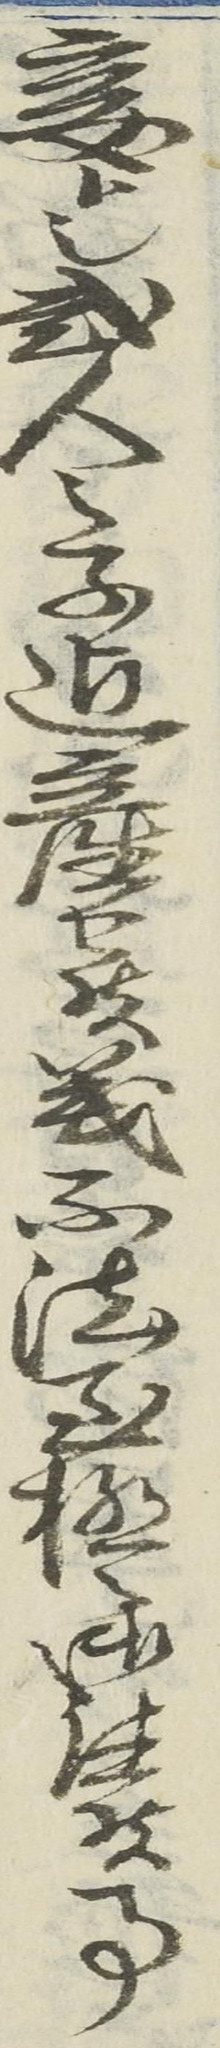妾トシ弐人之子迄産セ候義不法至極ニ御座候事
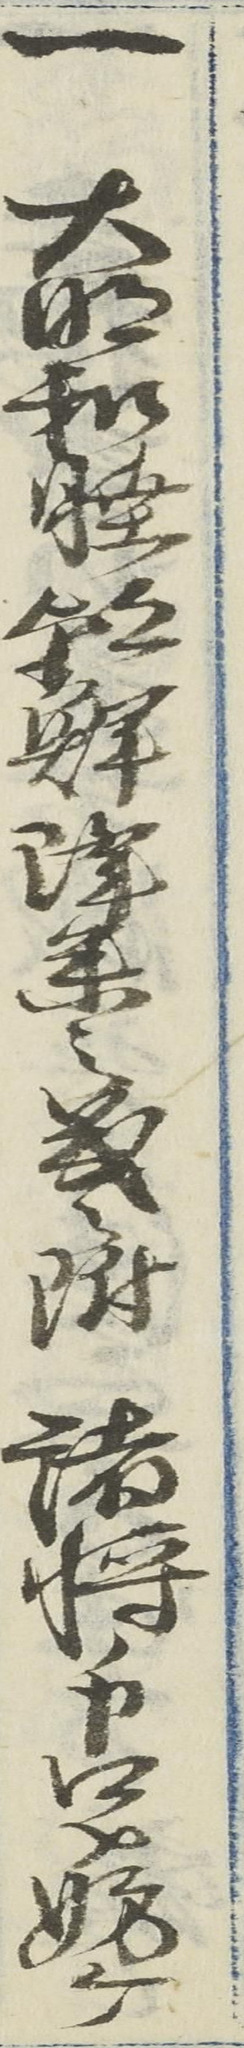一大明和睦朝鮮降参之義ニ附諸将ノ申口ヲ妨ケ
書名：伏水大地震
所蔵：東京大学地震研究所図書室 Earthquake Research Institute Library, The University of Tokyo, JAPAN
